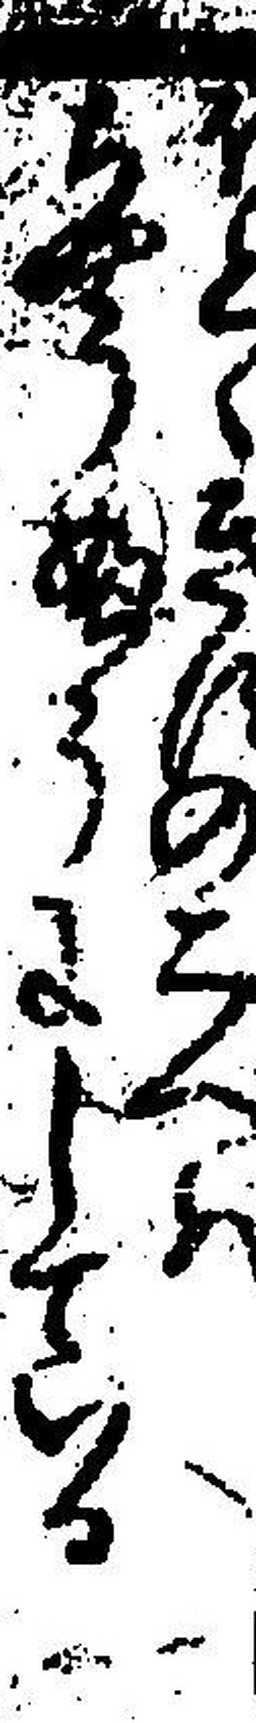ちやうふうにしている

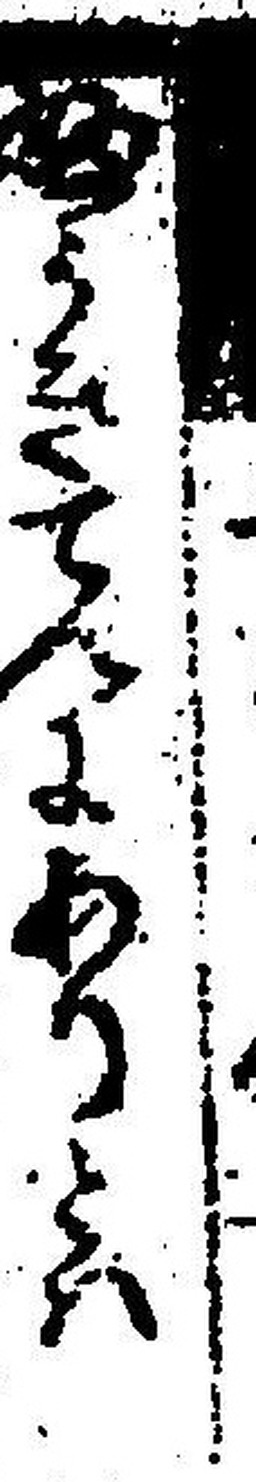ふうきてんにありとは
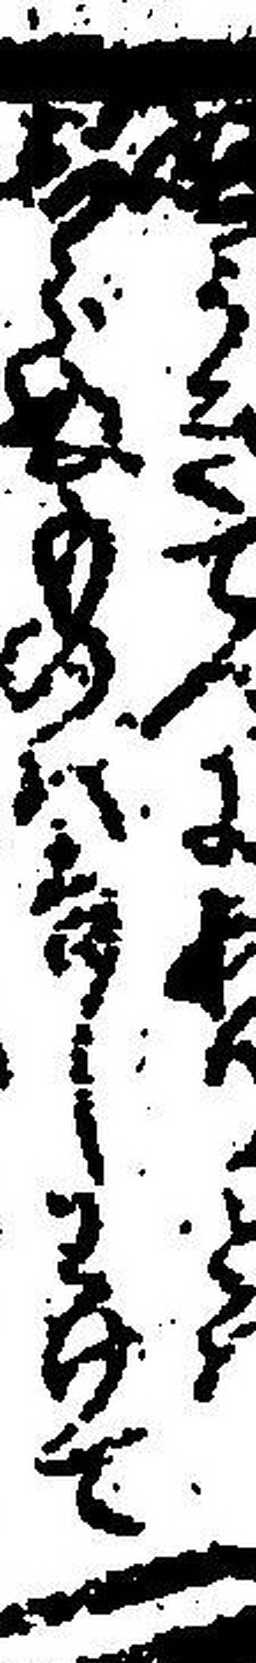しらぬものはなしわけて
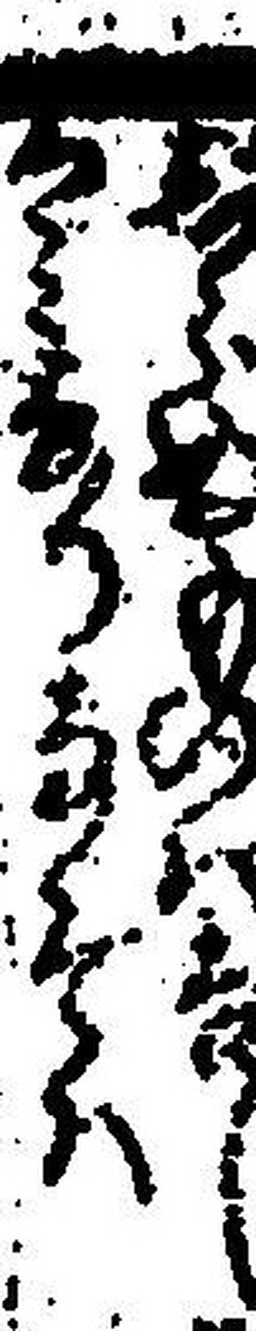かみなりなそは
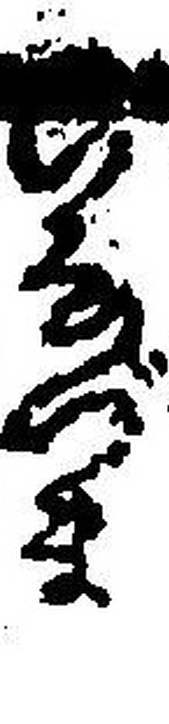いなづま
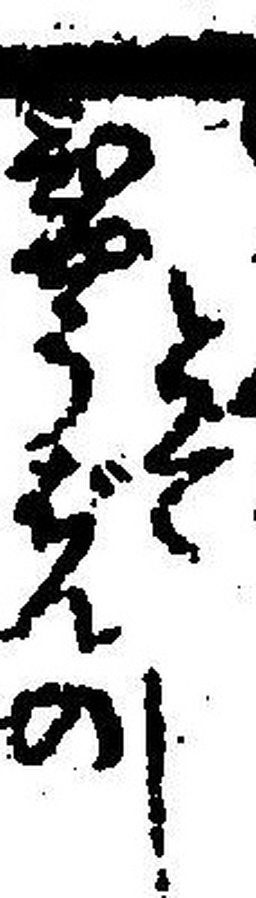ひやうばんの
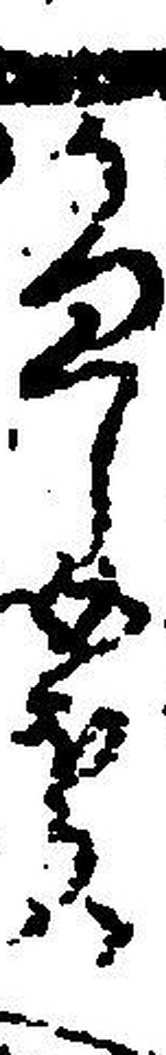うつくし女ほうは
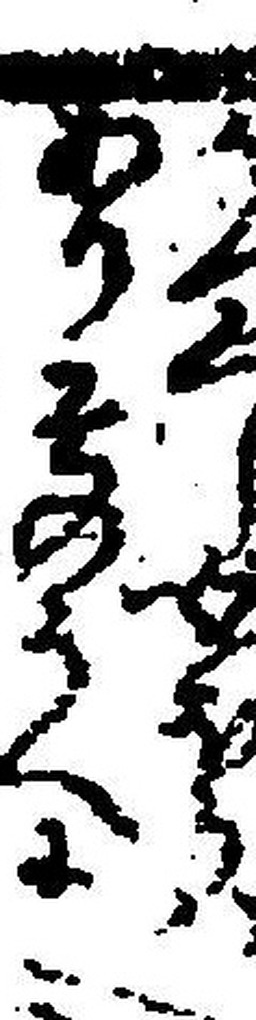ありそのうへに
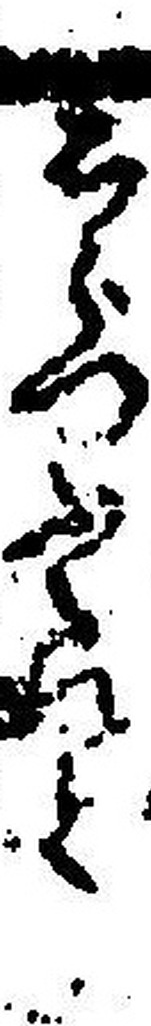はらつふくれと
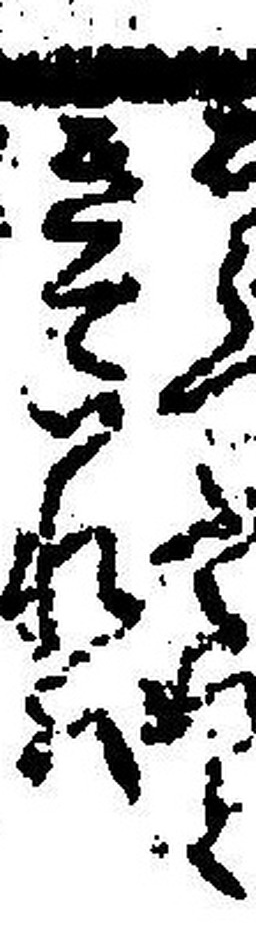きていれは
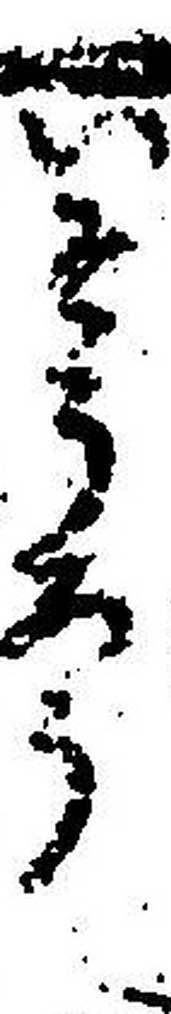いそうろう
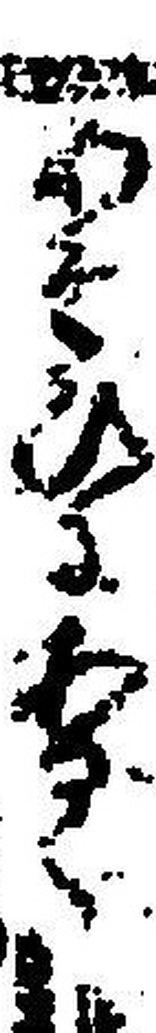あそひにあるく
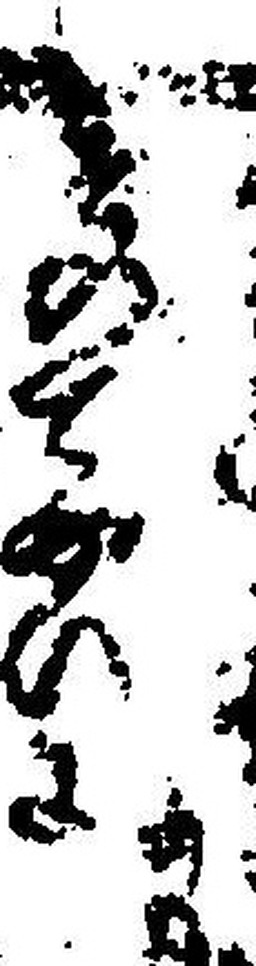そのてやいに
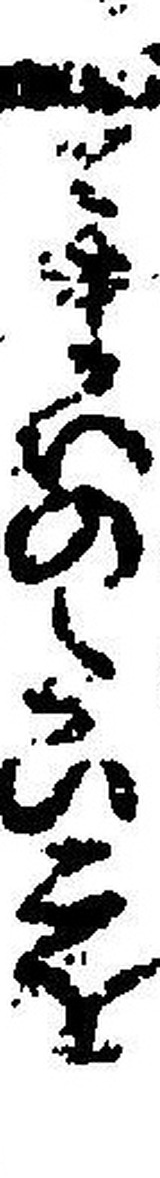てまいのたいこを
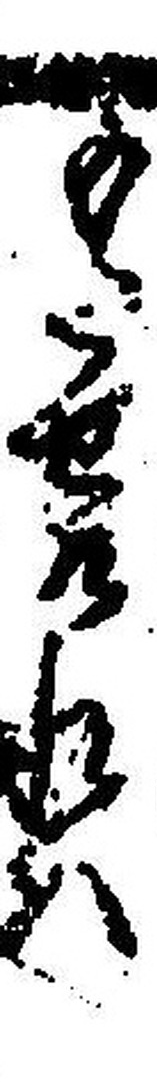もたせけれは
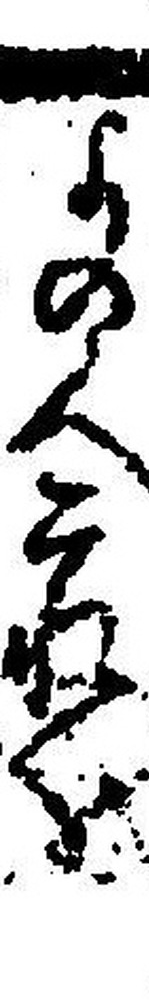よの人これを
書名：天竺儲之筋 / 市場通笑作
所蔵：東京大学総合図書館 General Library in the University of Tokyo, JAPAN
